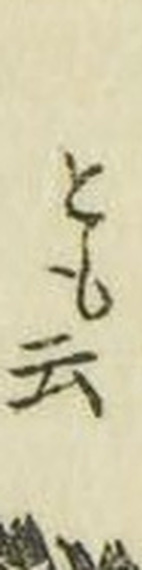とも云

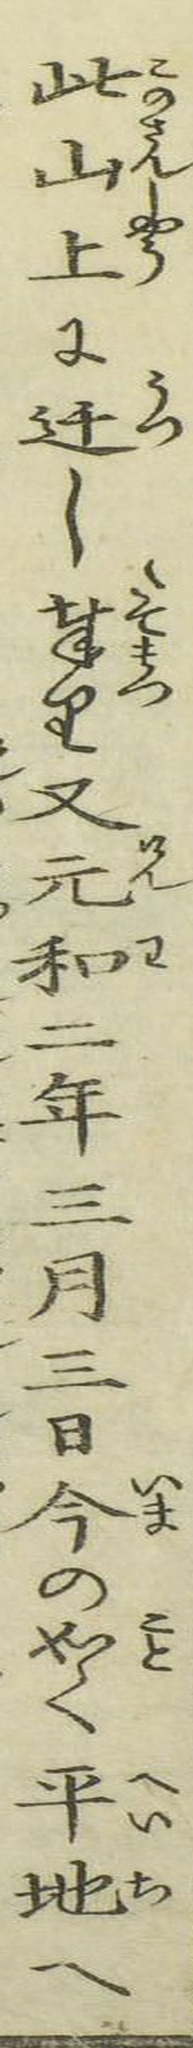此山上に迁し奉り又元和二年三月三日今の如く平地
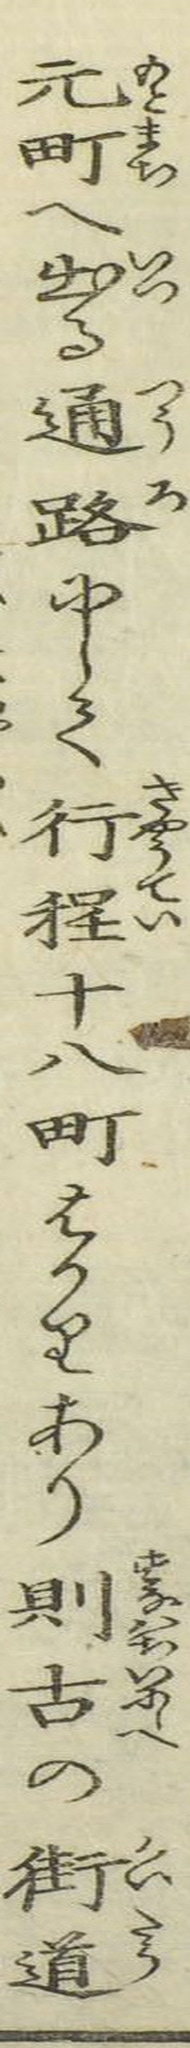元町へ出る通路にして行程十八町はかりあり則古の街道
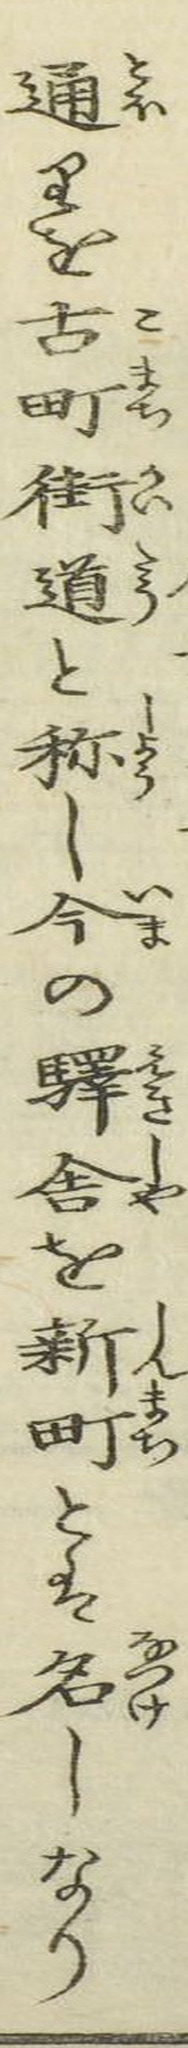通りを古町街道と称し今の驛舎を新町とは名しなり
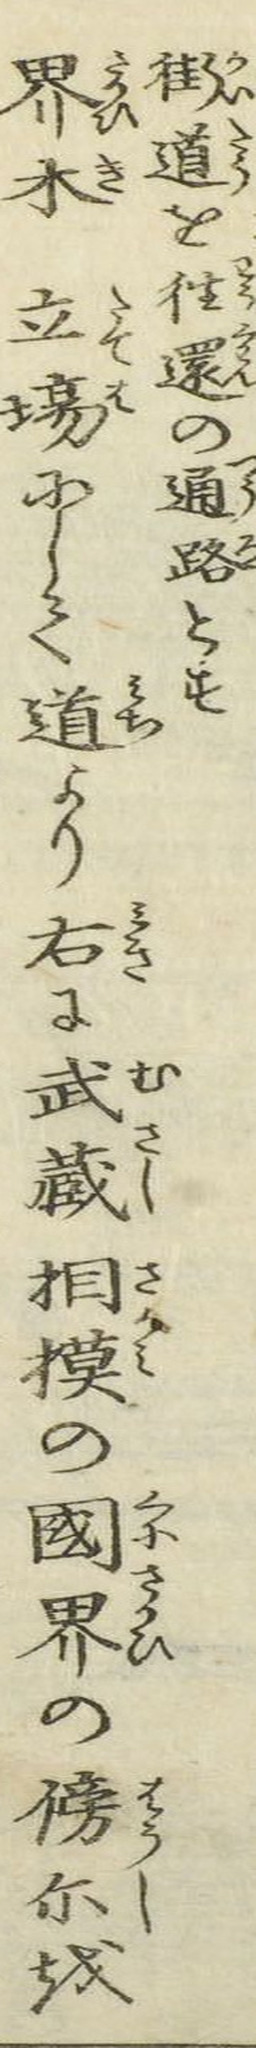界木立塲にして道より右に武蔵相模の國界の傍尓を
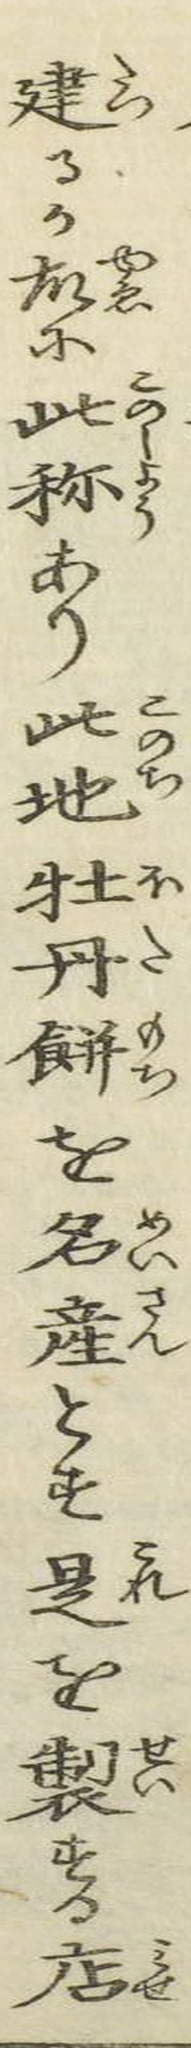建るか故に此称あり此地牡丹餅を名産とす是を製する店
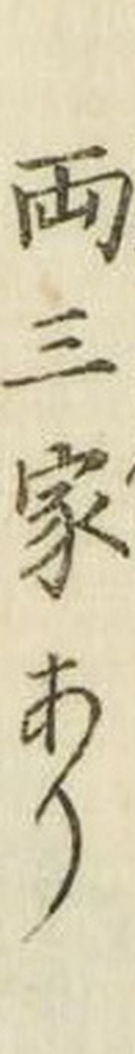両三家あり
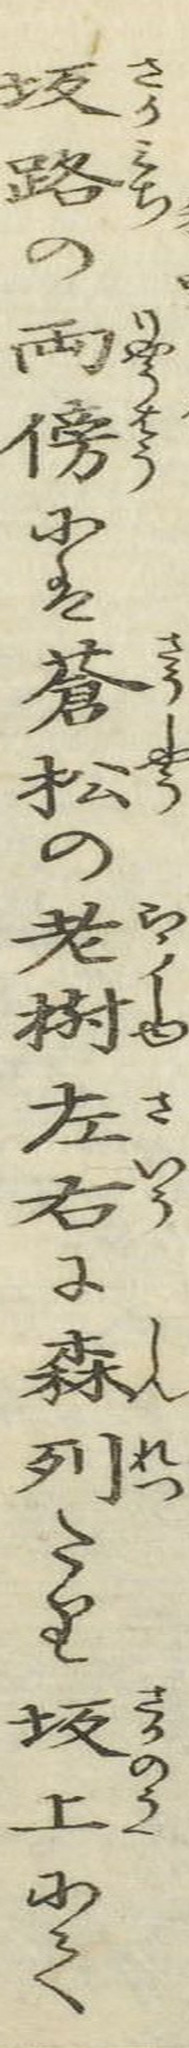坂路の両傍には蒼松の老樹左右に森列たり坂上にて
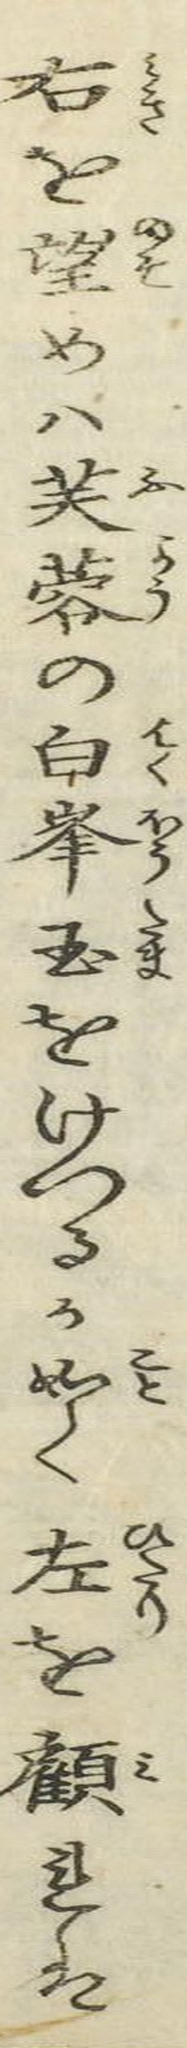右を望めは芙蓉の白峯玉をけつるか如く左を顧れは
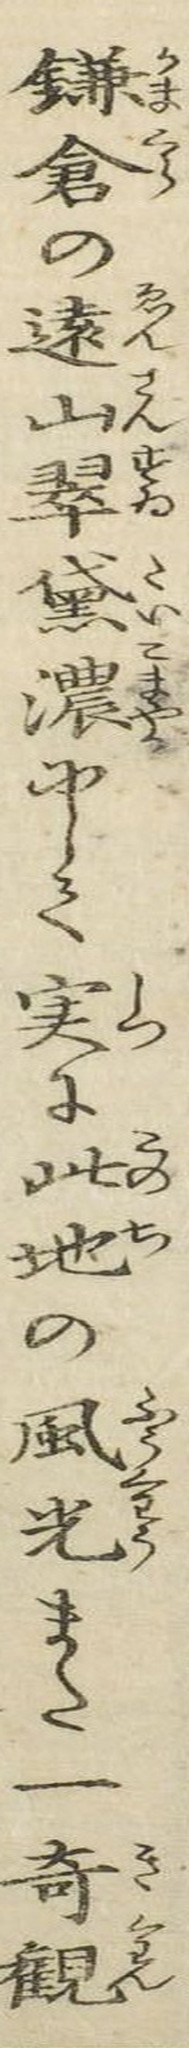鎌倉の遠山翠黛濃にして実に此地の風光また一奇観
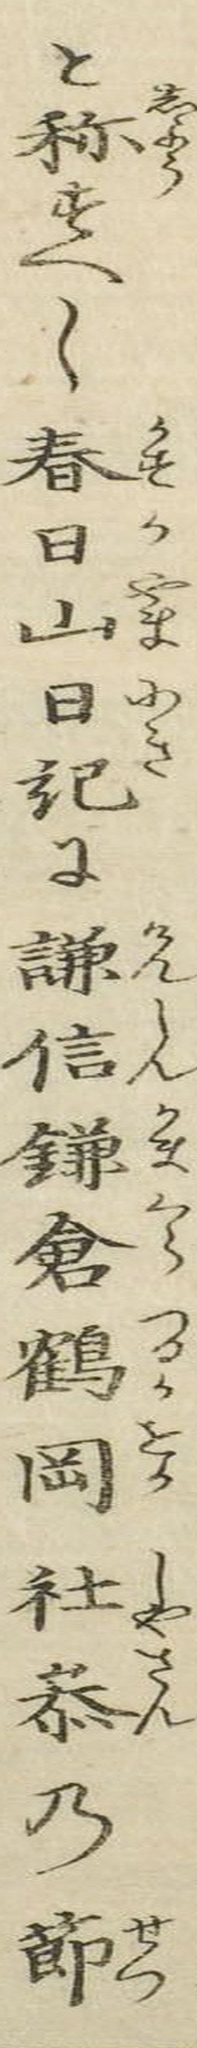と称すへし春日山日記に謙信鎌倉鶴岡社參の節
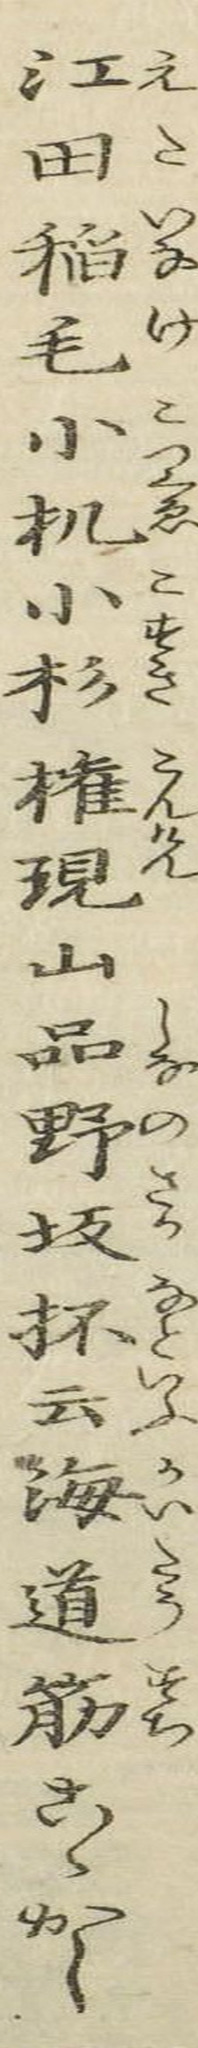江田稲毛小机小杉権現山品野坂抔云海道筋こゝかし
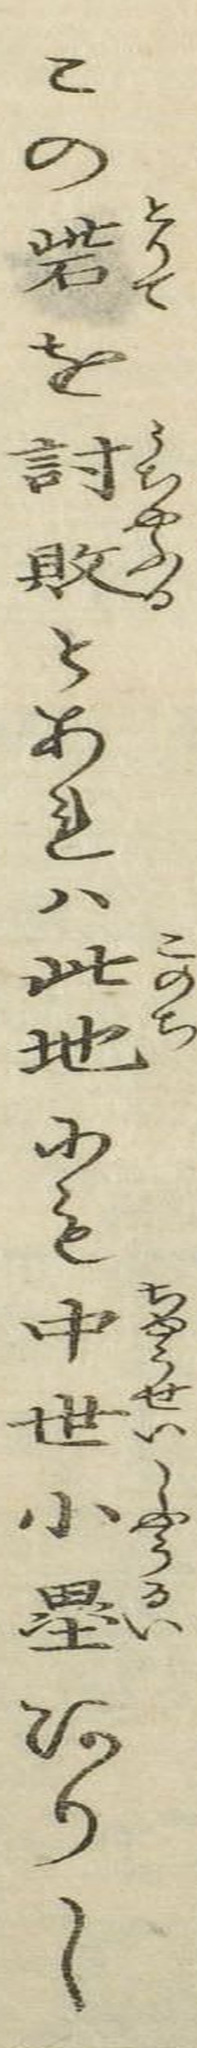この砦を討敗とあれは此地にも中世小塁ありし
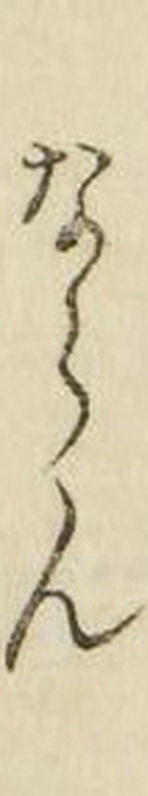ならん
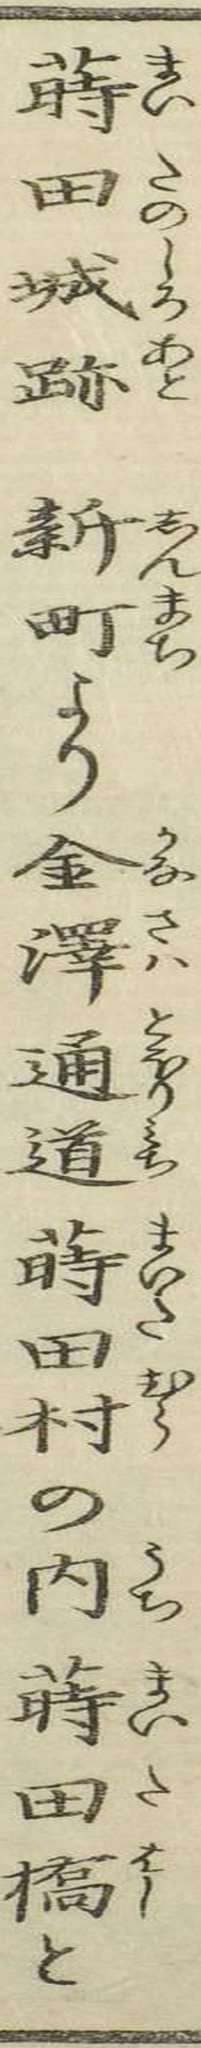蒔田城跡新町より金澤通道蒔田村の内蒔田橋と
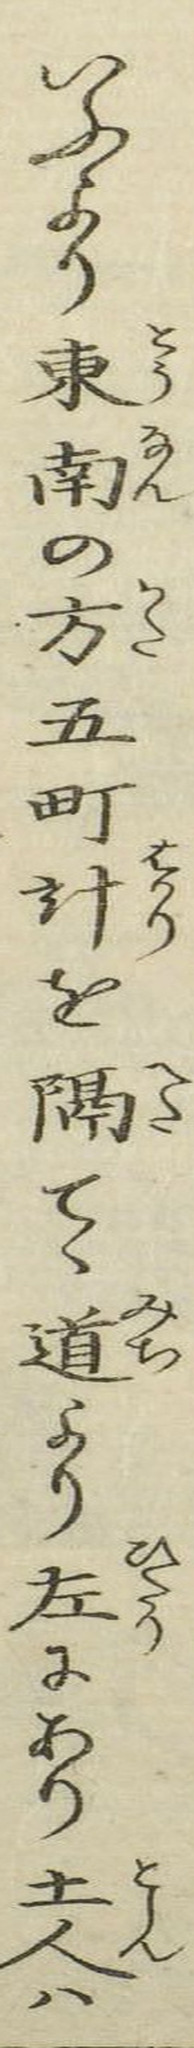いふより東南の方五町計を隔てゝ道より左にあり土人は
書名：江戸名所図会 20巻 巻之6
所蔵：東京学芸大学教育コンテンツアーカイブ
